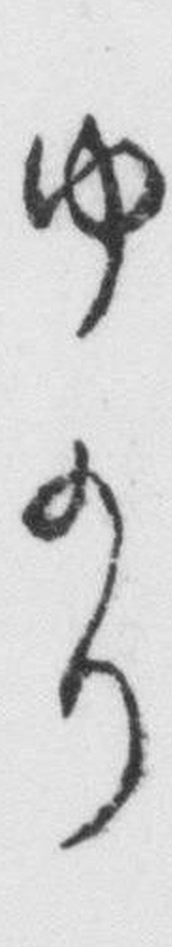ゆのり
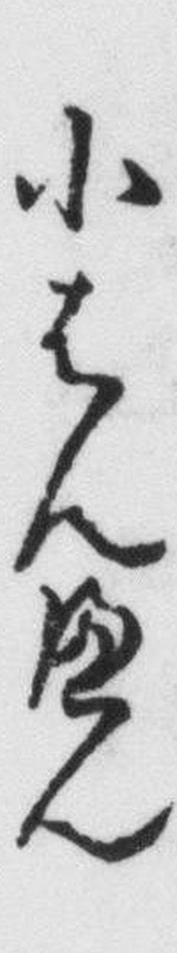小はん扁ん

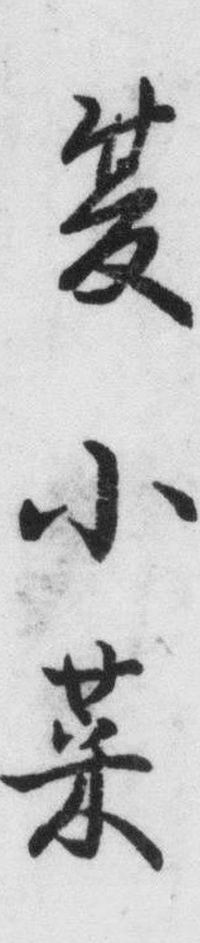夏小菜
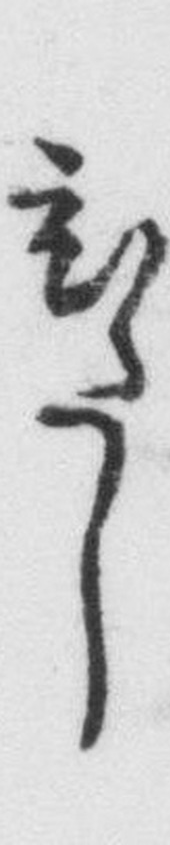飛たし
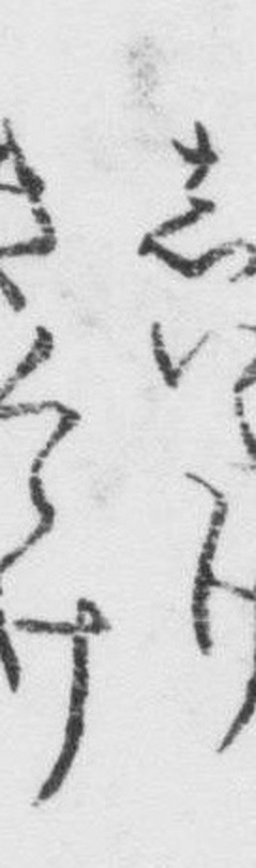きくらけ
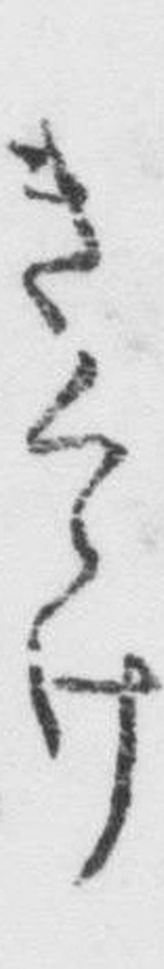きくらけ
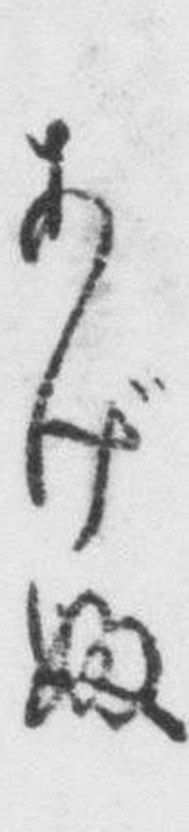あげ婦

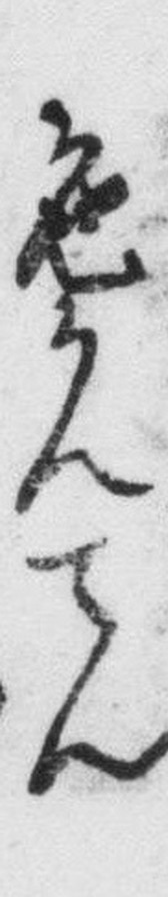色かんてん
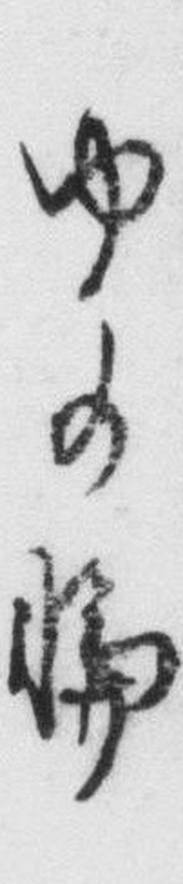ゆの輪
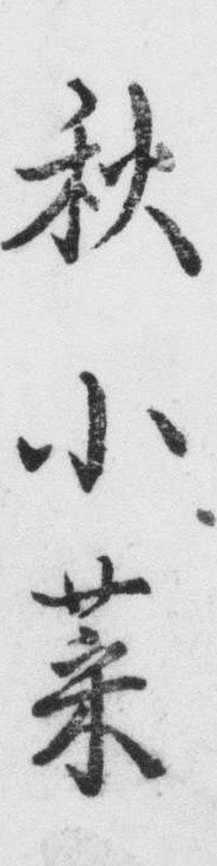秋小菜
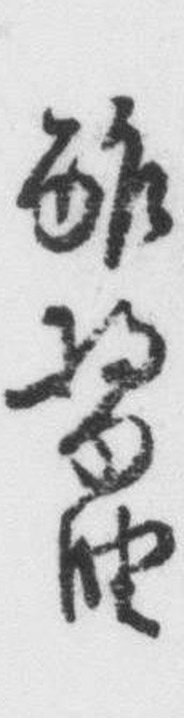酢醤油
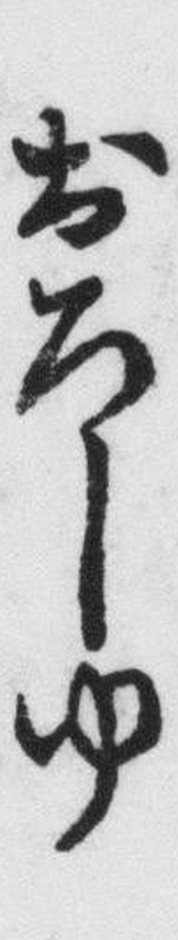おろしゆ
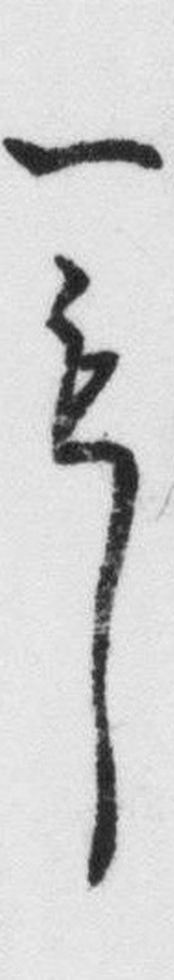一もし

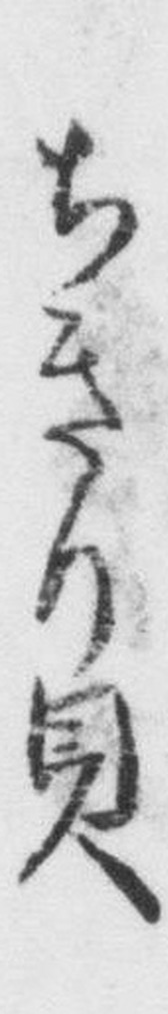ちきり貝
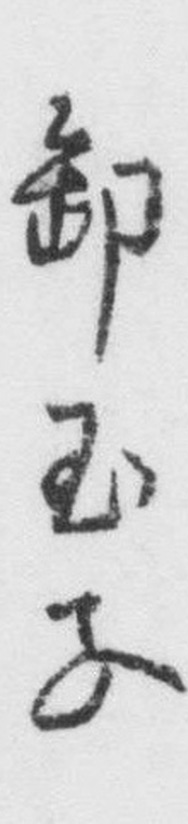卸玉子
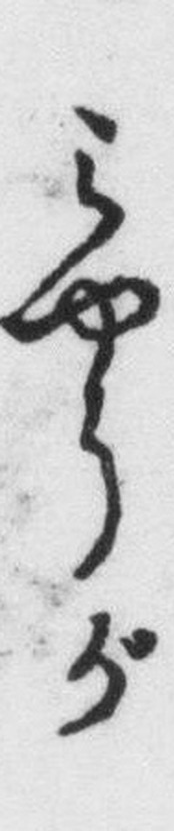みやうが
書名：普茶料理抄
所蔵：大阪府立大学学術情報センター 国文学研究資料館
